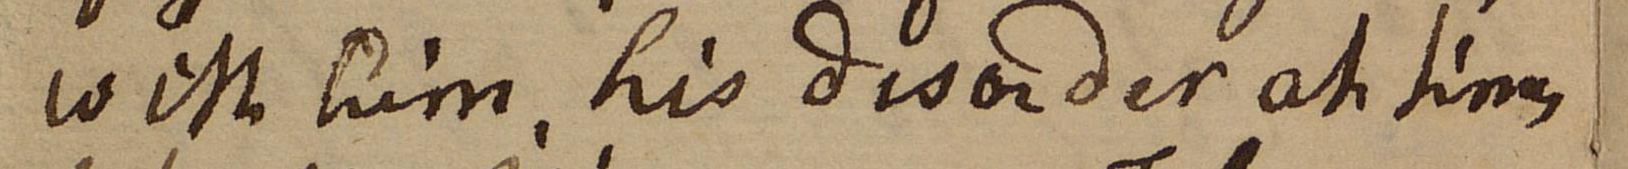with him his disorder at time,
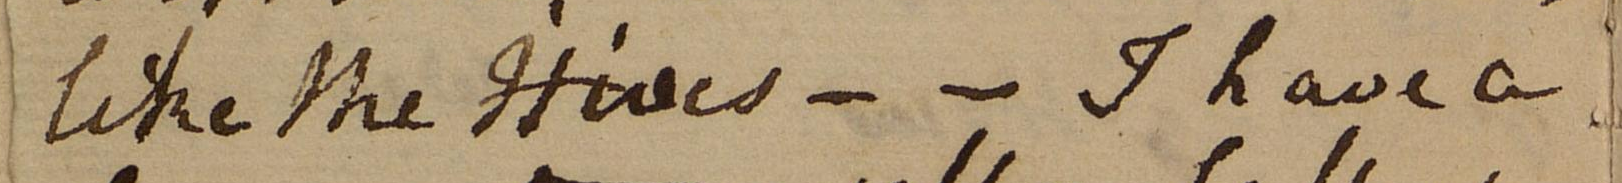like the Hives-- I have a
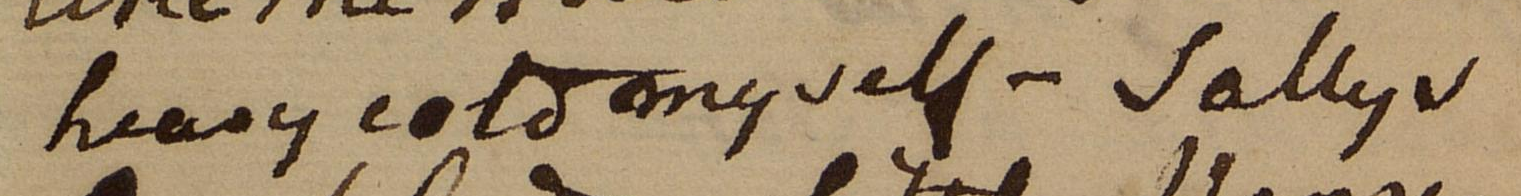heavy cold myself- Sallys
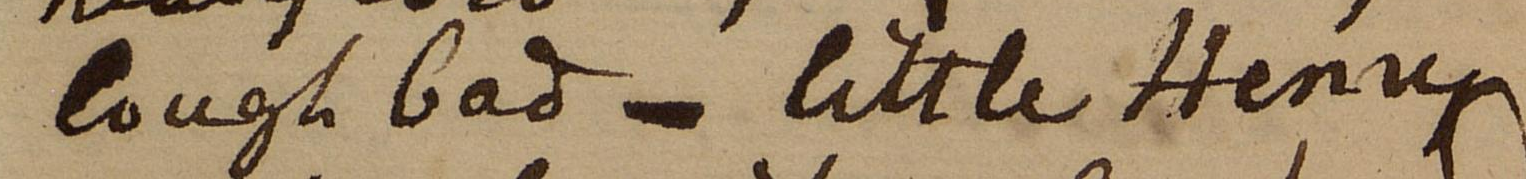Cough bad- little Henry
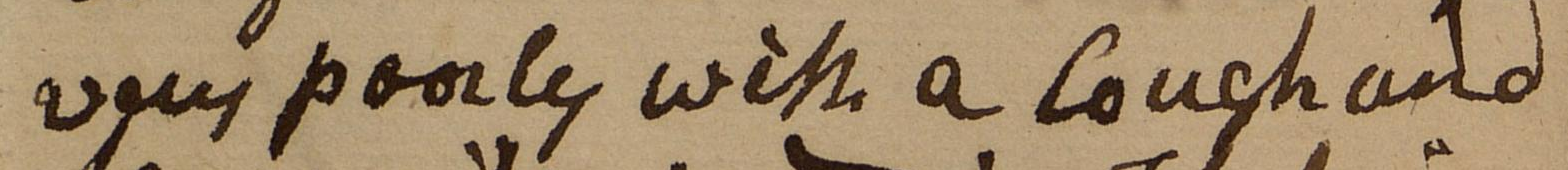very poorly with a Cough and
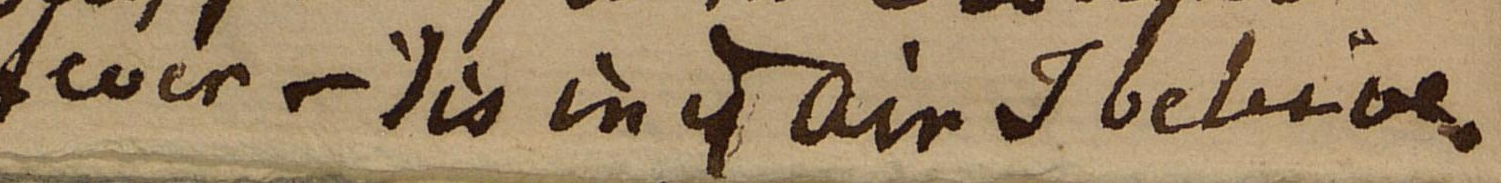fever- 'tis in y^e air I beleive
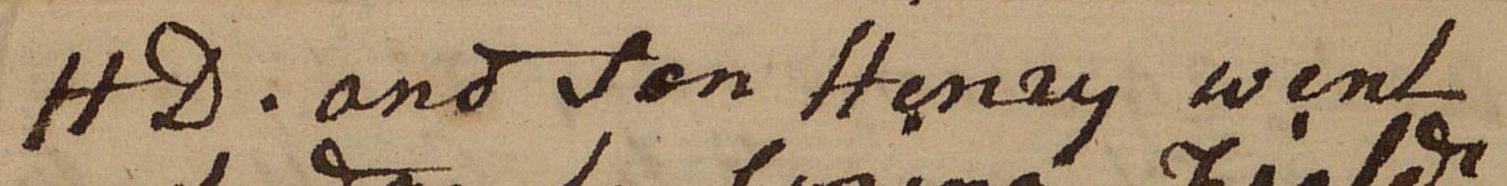HD. and Son Henry went
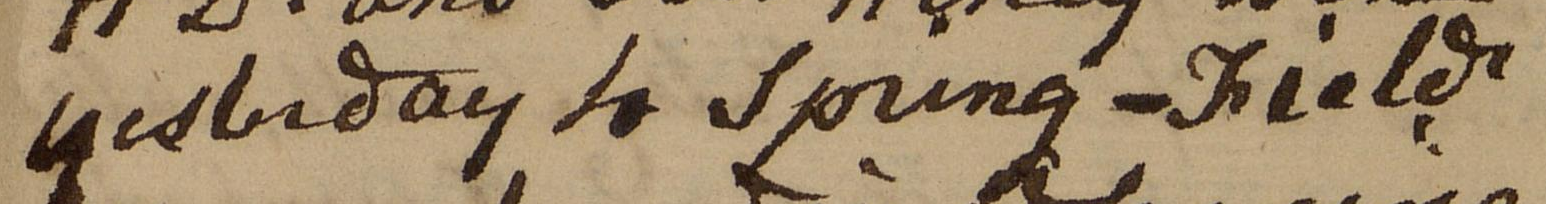yesterday to Spring-Field
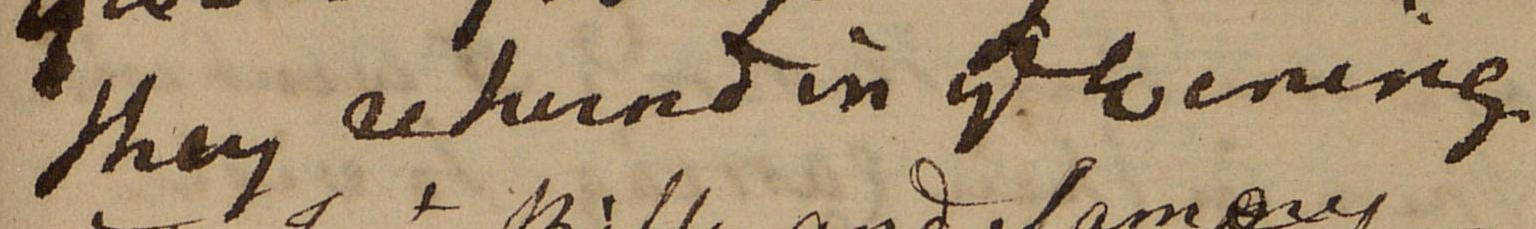they returnd in y^e Evening
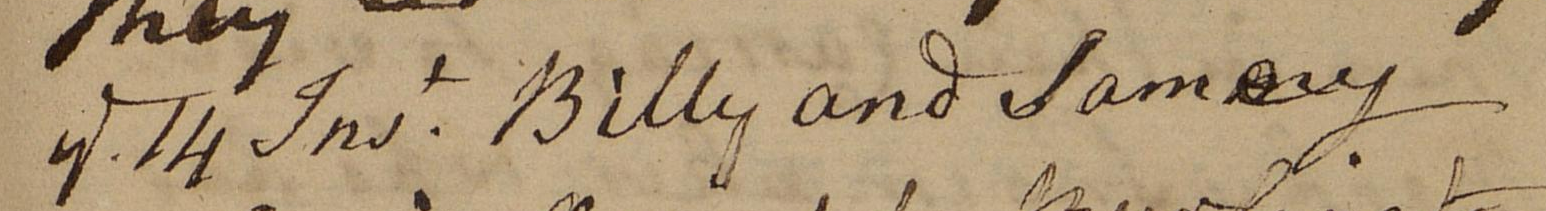y^e 14 Ins^t. Billy and Sammy
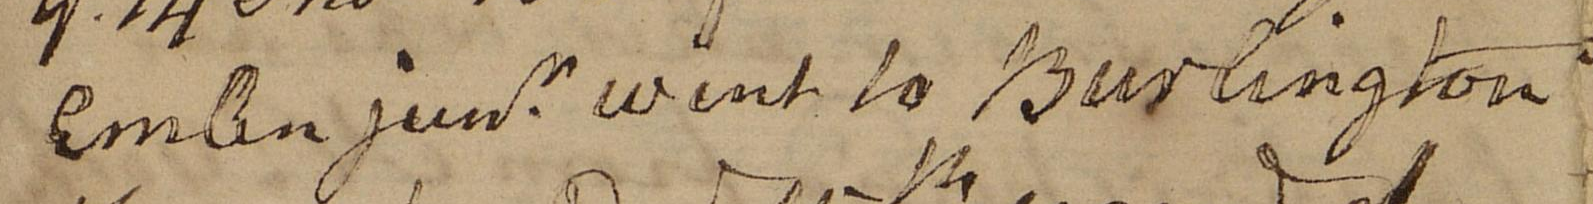Emlen jun^r. went to Burlington
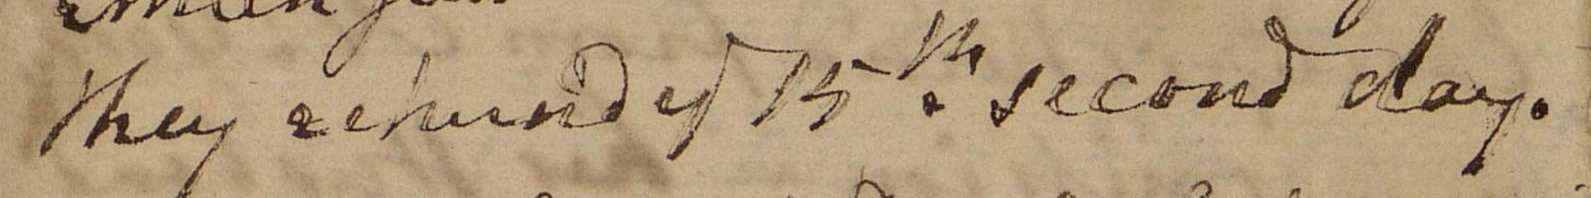they returnd y^e 15^th. second day.
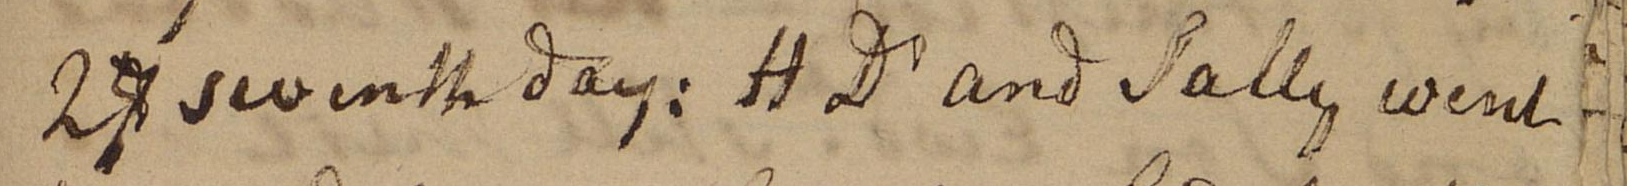27 seventh day: HD and Sally went
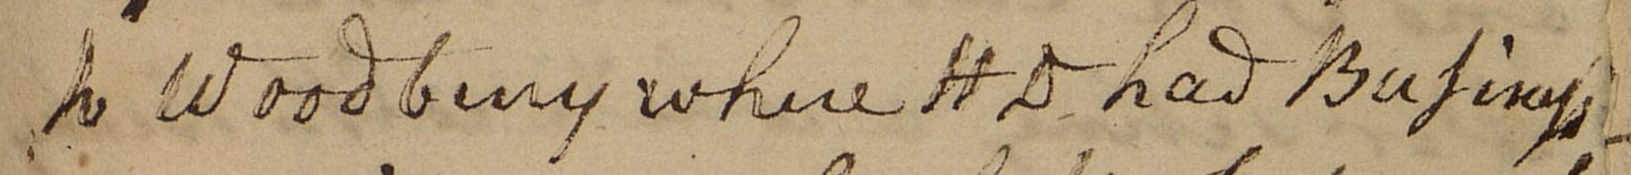to Woodbury where HD had Business,
